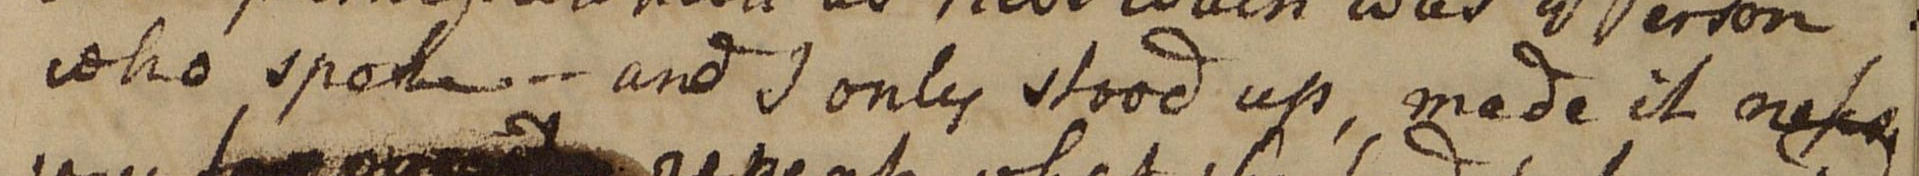who spoke-- and I only stood up, made it nesse
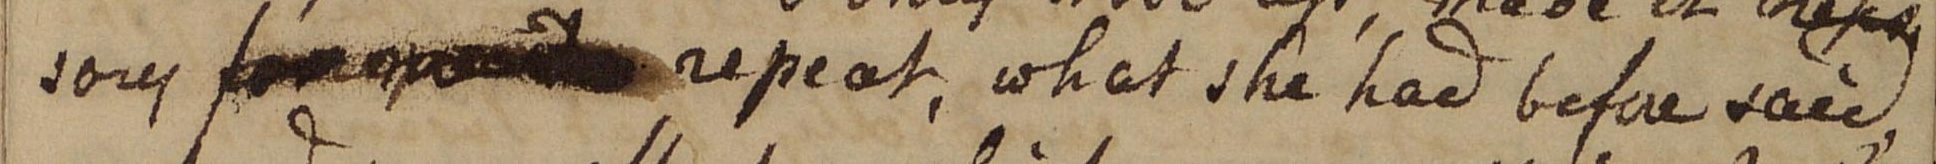sory [_______] repeat, what she had before said,
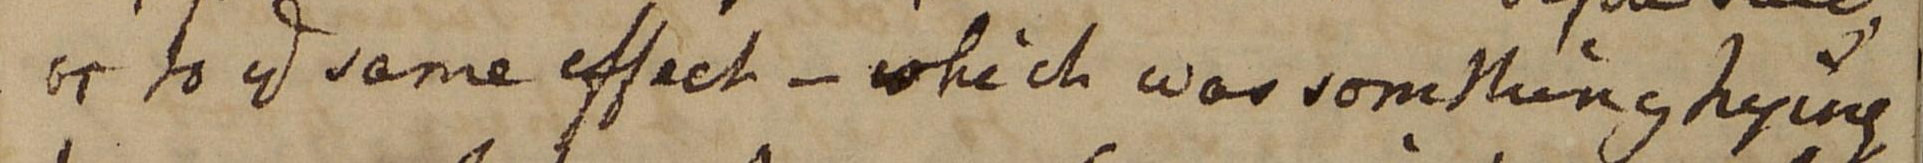or to y^e same effect- which was something trying,
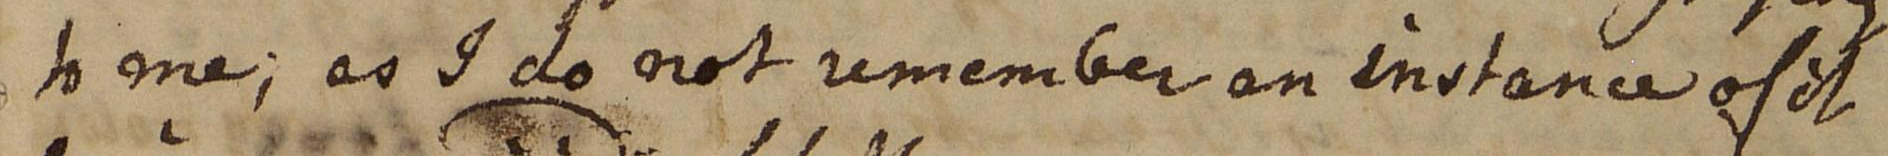to me; as I do not remember an instance of it
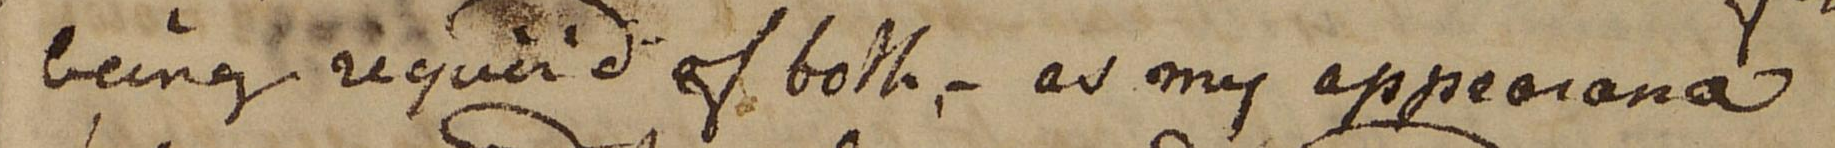being requir'd of both,- as my appearance
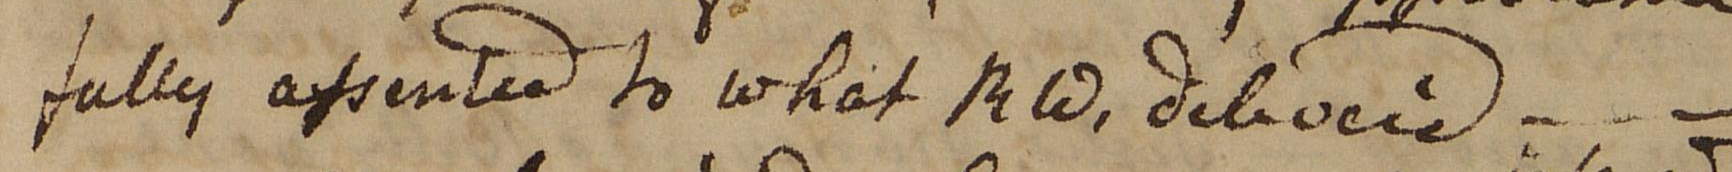fully assented to what RW, dieliver'd--
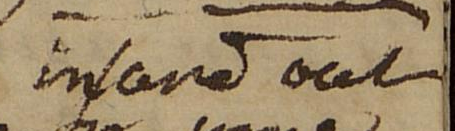in and out
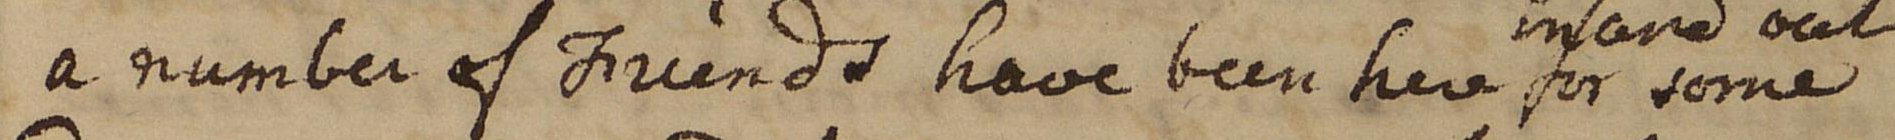a number of Friends have been here ^ for some
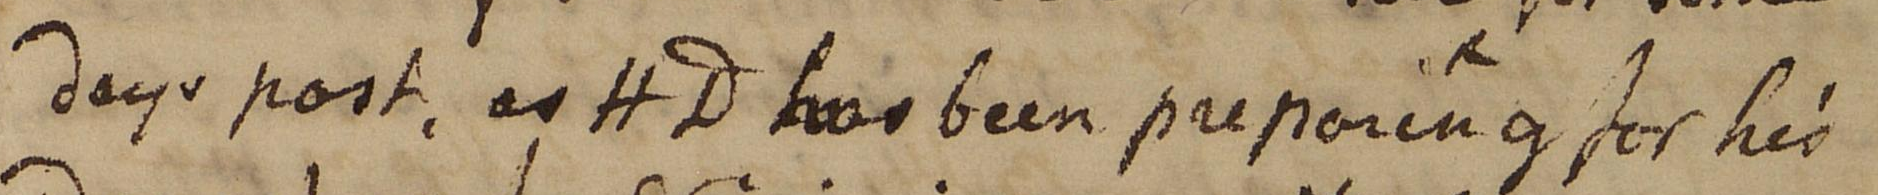days past, as HD has been preparing for his
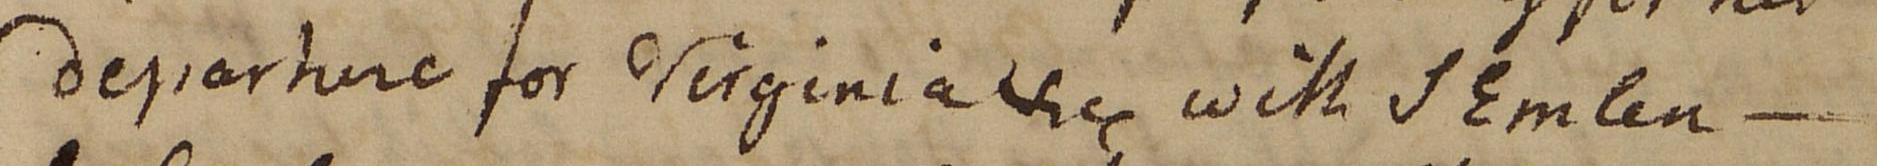departure for Virginia &c with S Emlen-
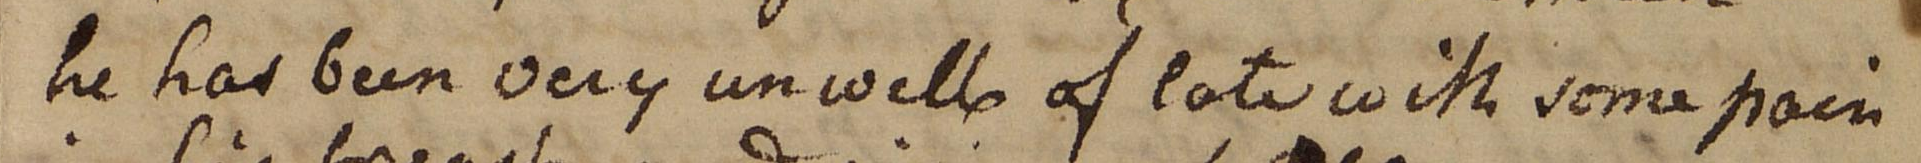he has been very unwell of late with some pain
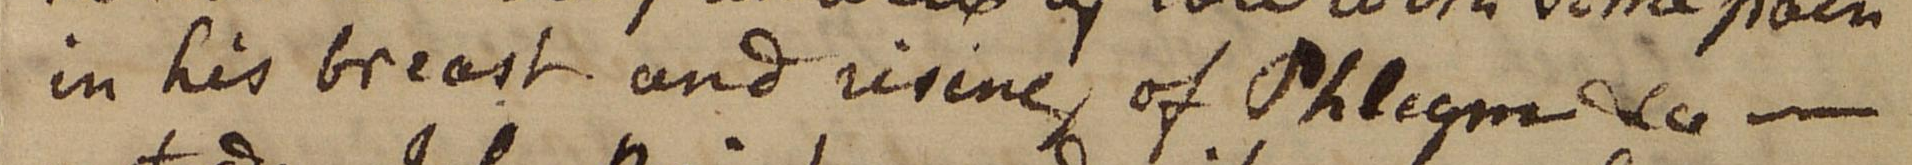in his breast and risine of Phlegm &c-
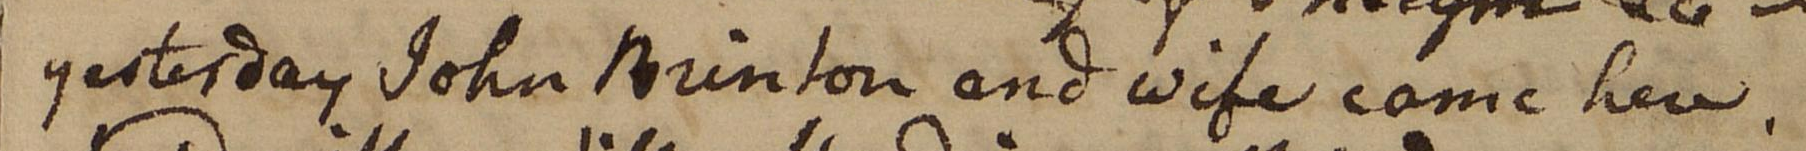yesterday John Brinton and Wife came here
